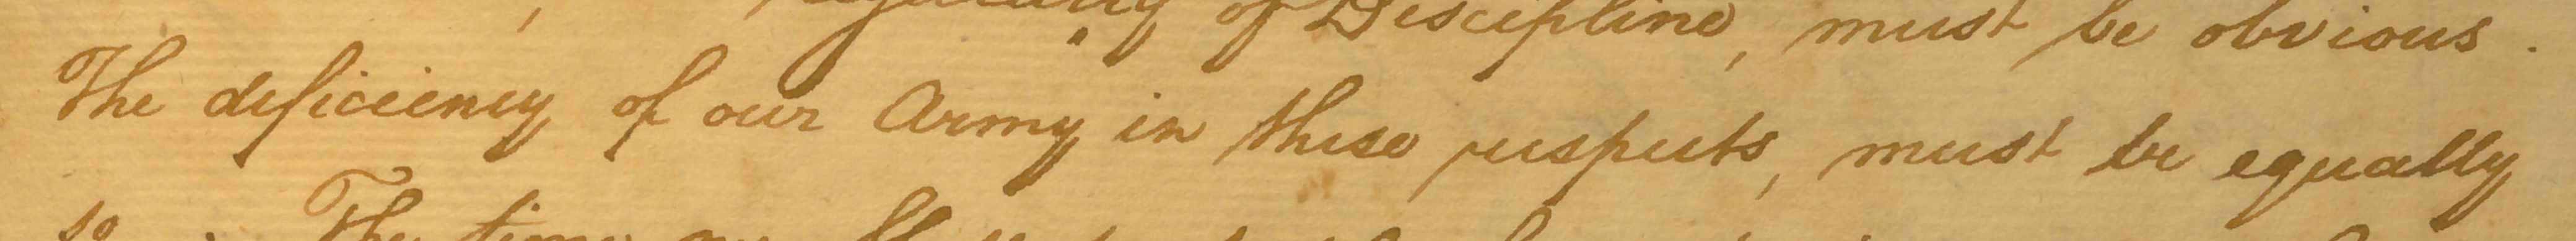The deficiency of our Army in these respects, must be equally
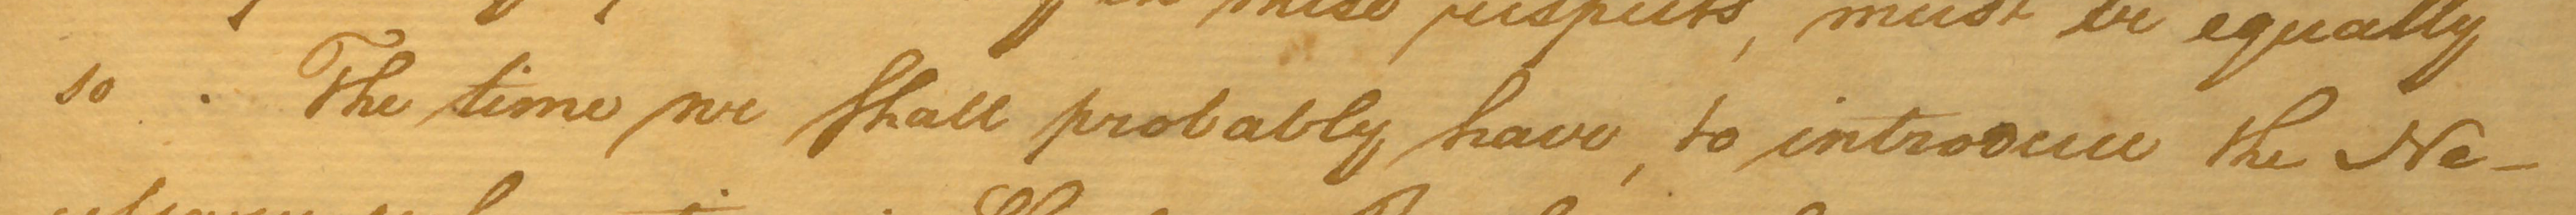so. The time we shall probably have, to introduce the Ne-
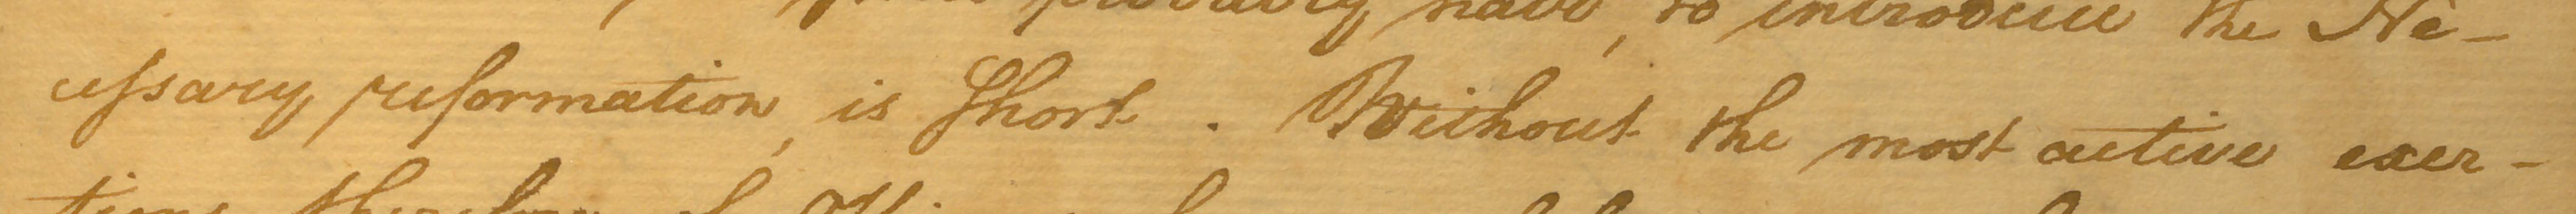cessary reformation, is short. Without the most active exer-
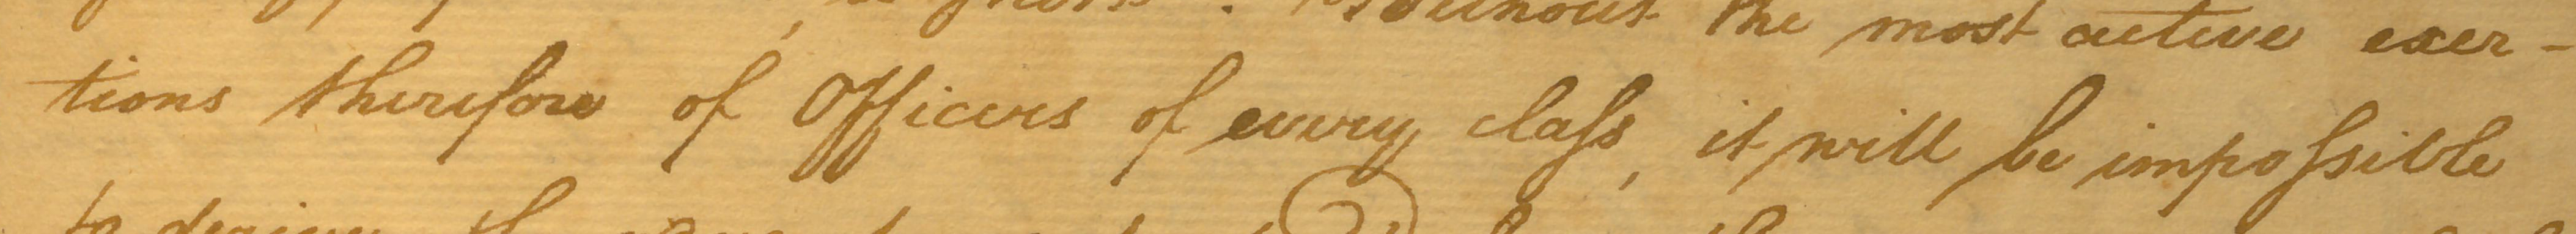tions therefore of Officers of every class, it will be impossible
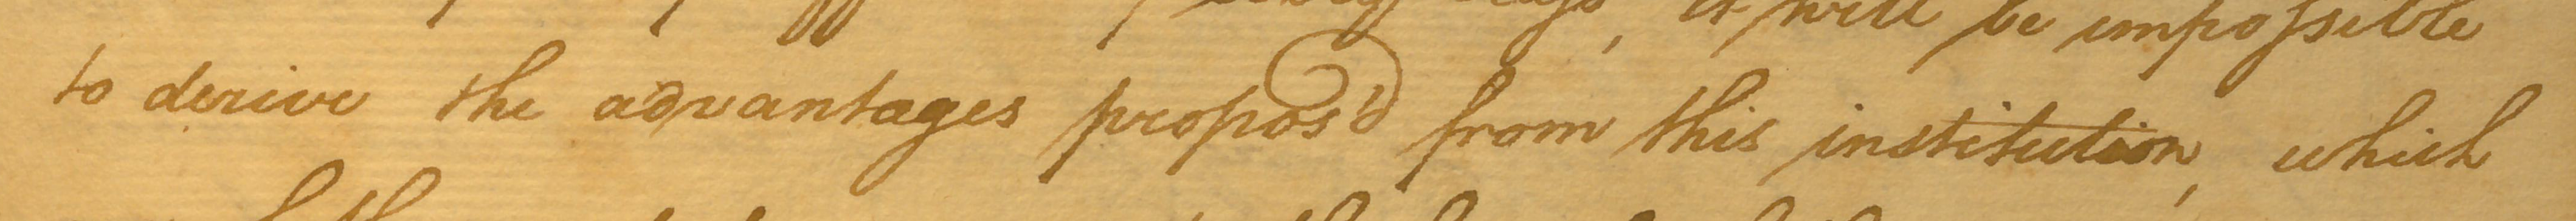to derive the advantages propos'd from this institution, which
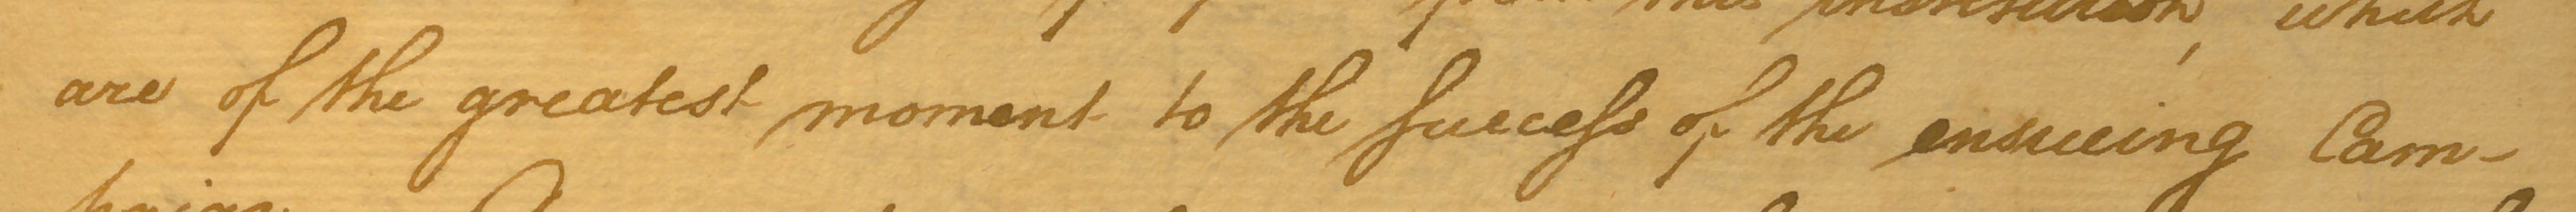are of the greatest moment to the success of the ensueing Cam-
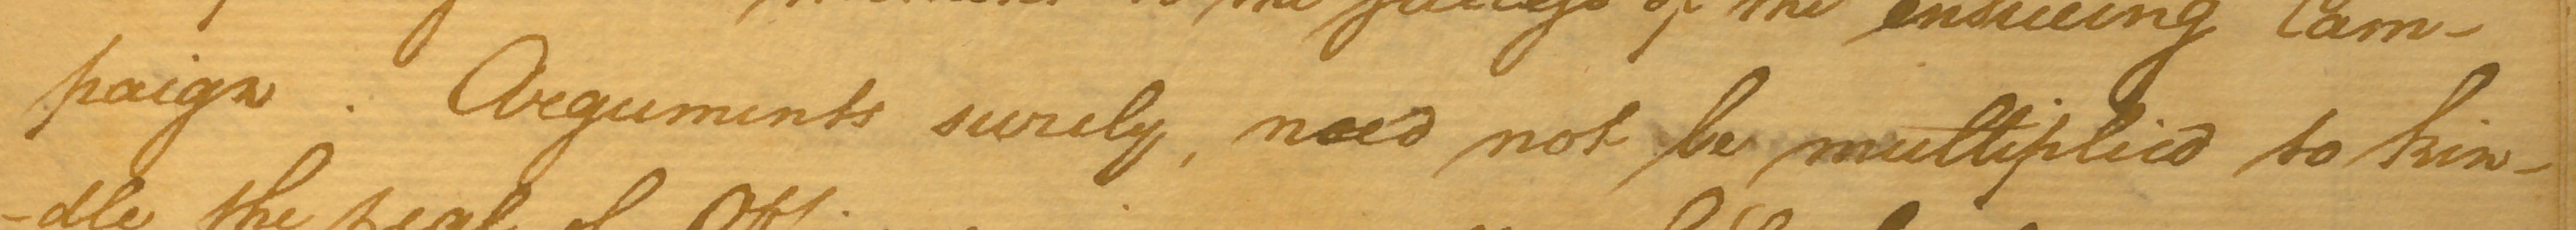paign. Arguments surely, need not be multiplied to kin-
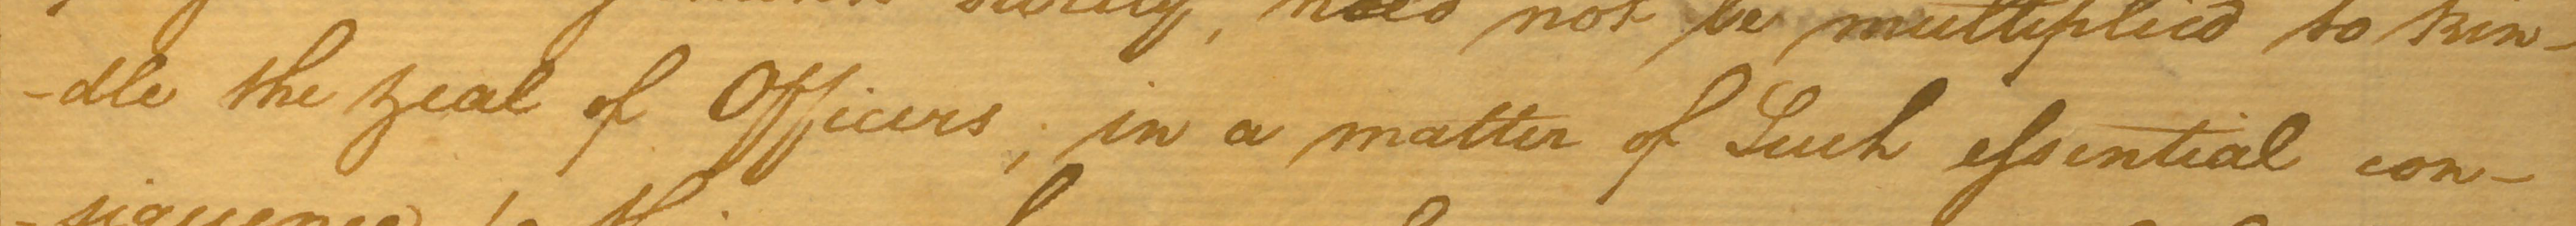-dle the zeal of Officers; in a matter of such essential con-
